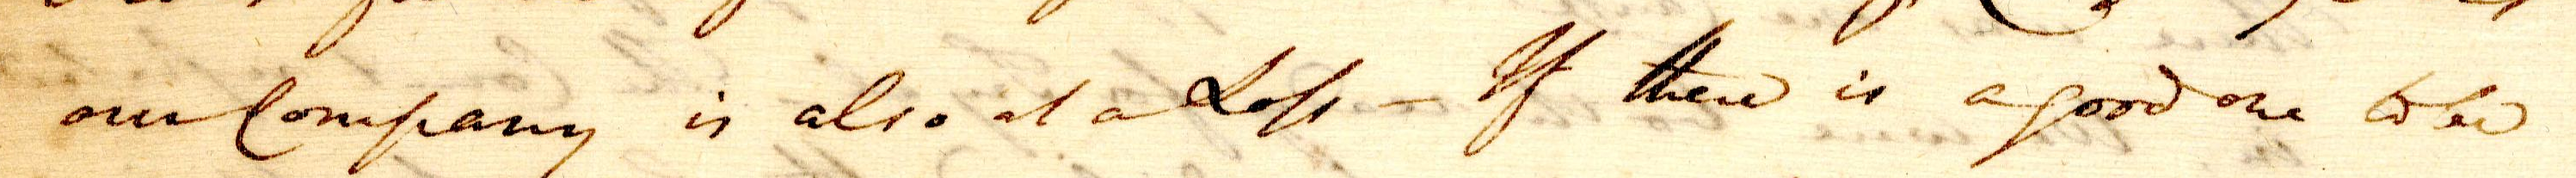our Company is also at a Loss. If there is a good one to be
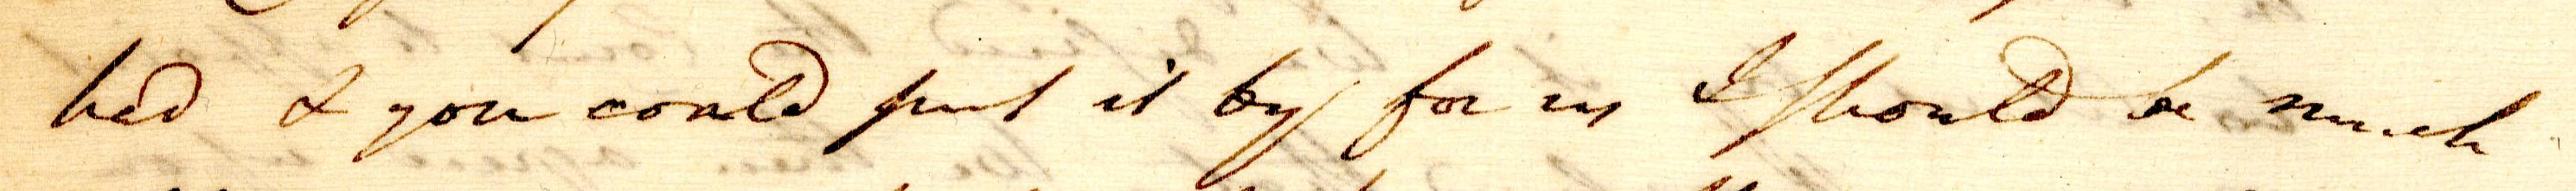had & you could put it by for us I should be much
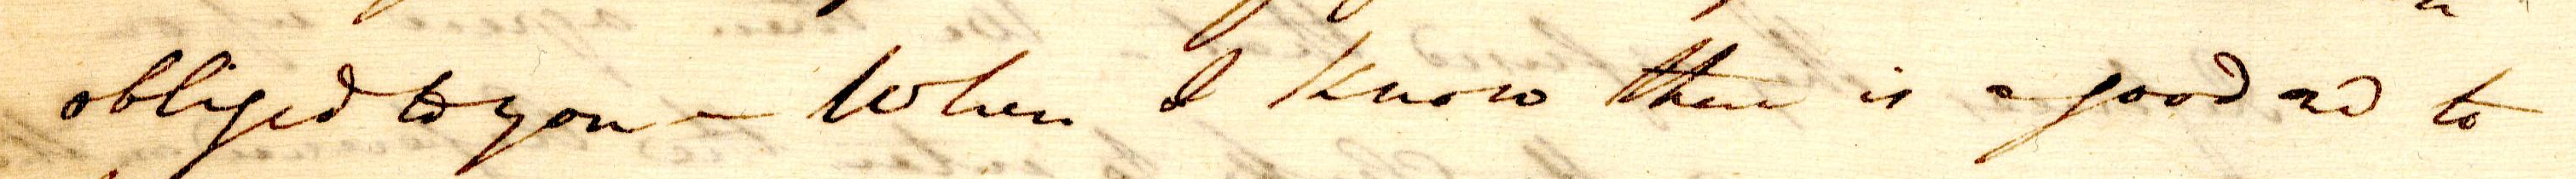obliged to you. When I know there is a good one to
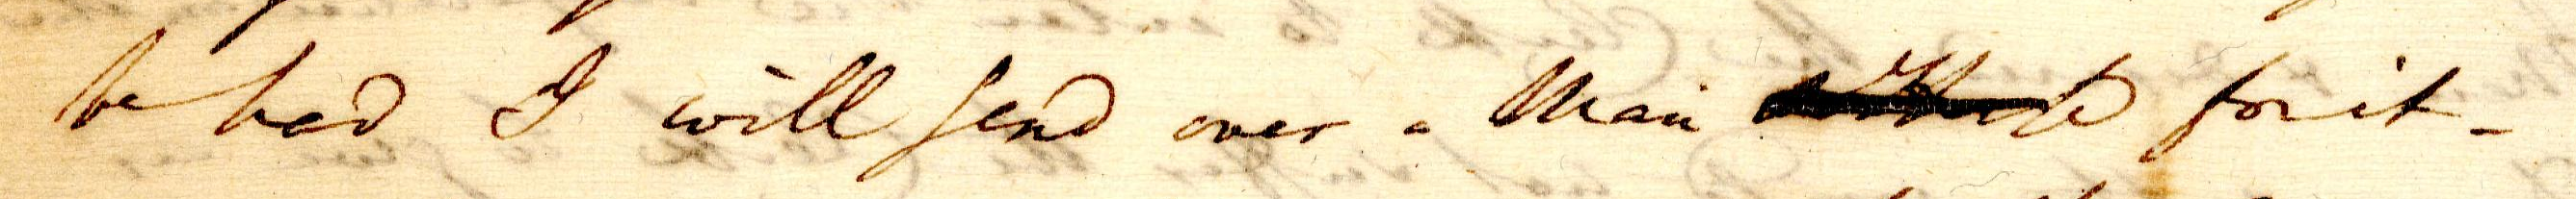be had I will send over a Man [_____] for it
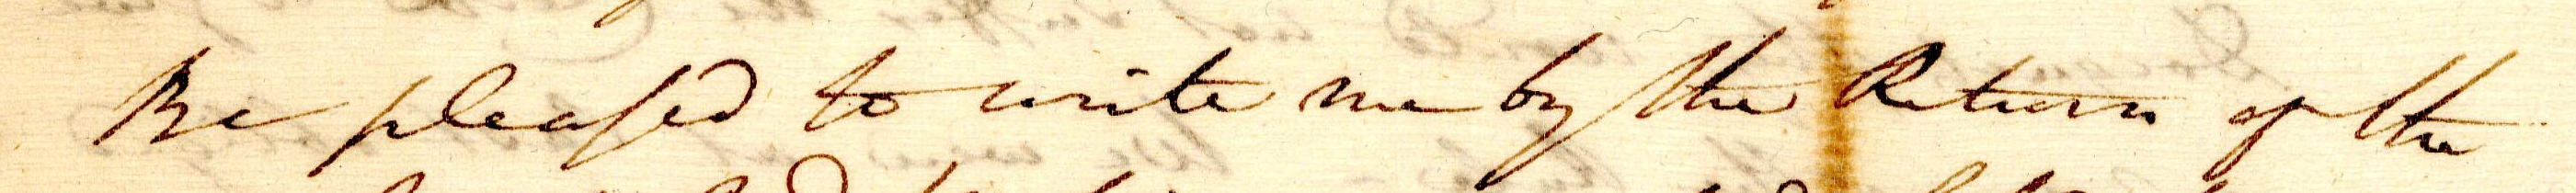Be pleased to write me by the Return of the
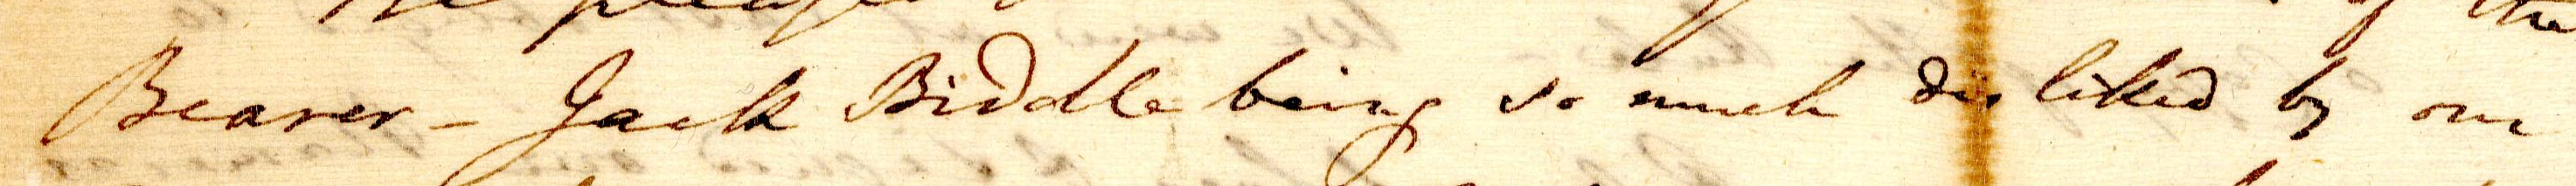Bearer. Jack Biddle being so much disliked by our
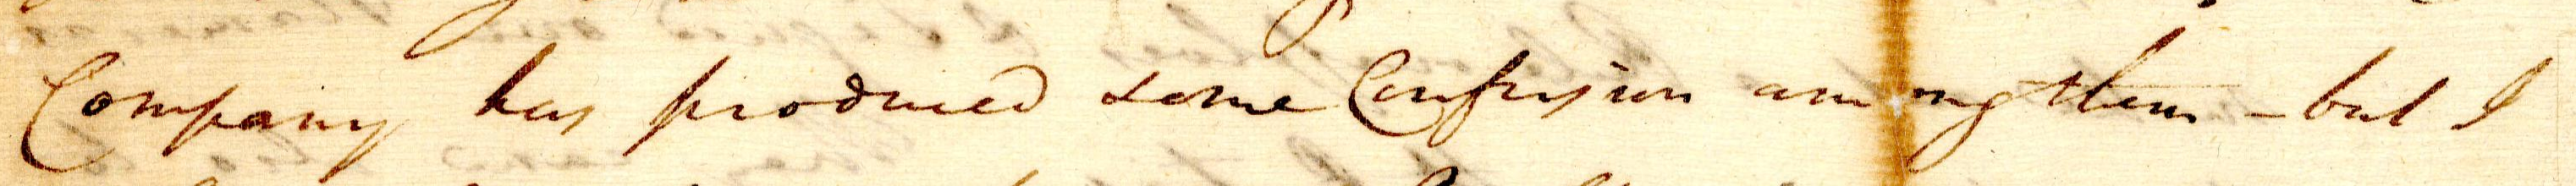Company has produced some Confusion among them, but I
